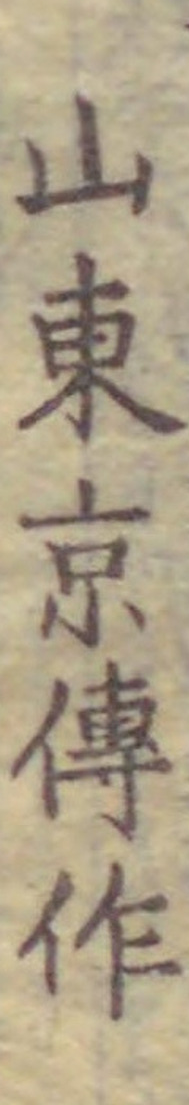山東京伝作
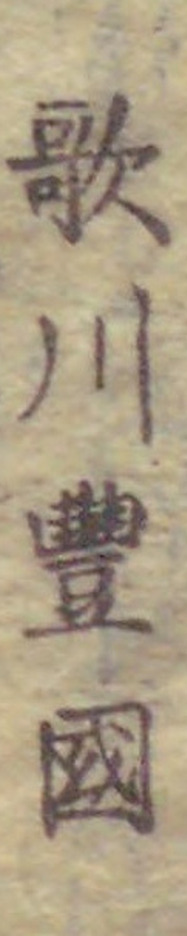歌川豊国
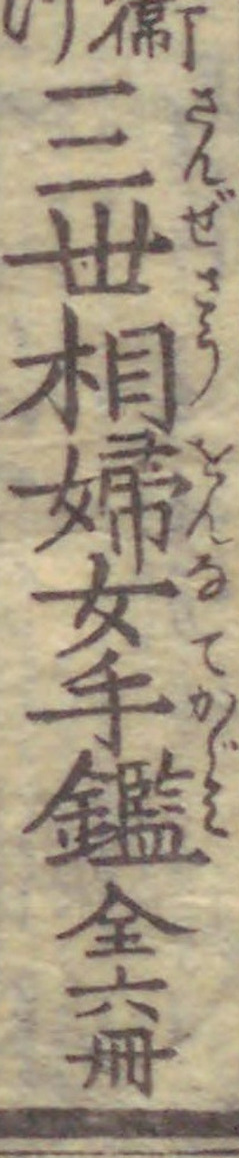三世相婦女手鑑全六冊
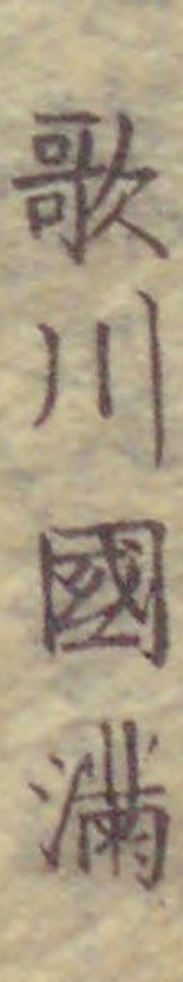歌川国満
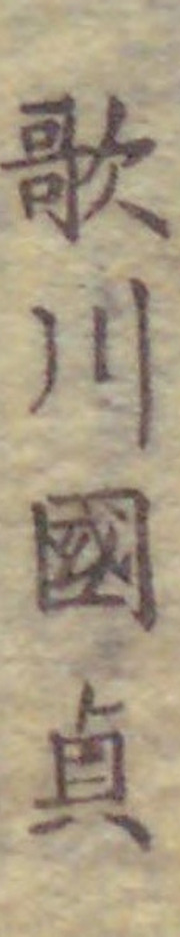歌川国貞
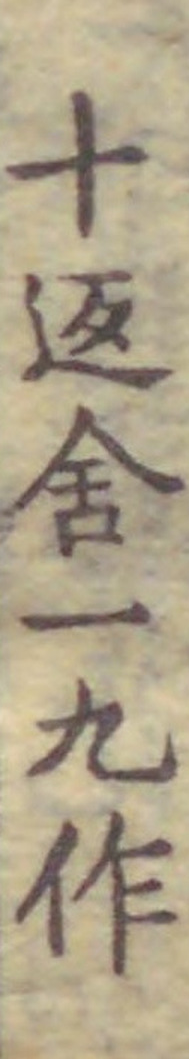十返舎一九作
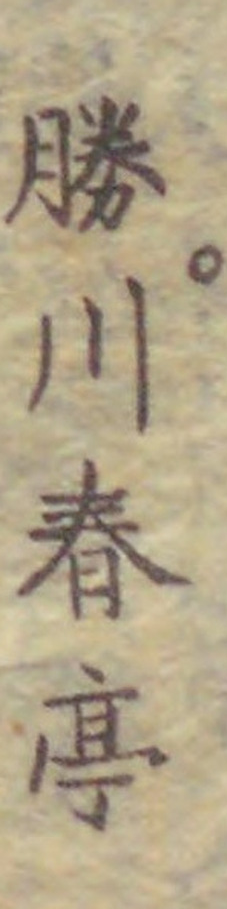勝川春亭
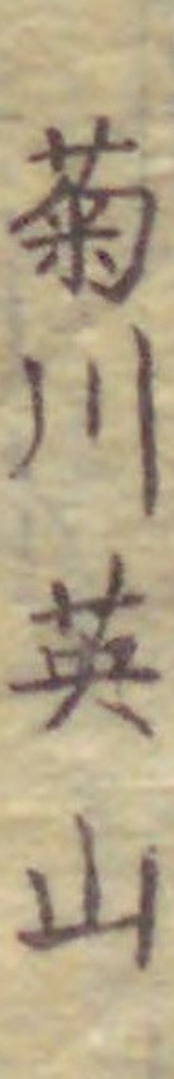菊川英山
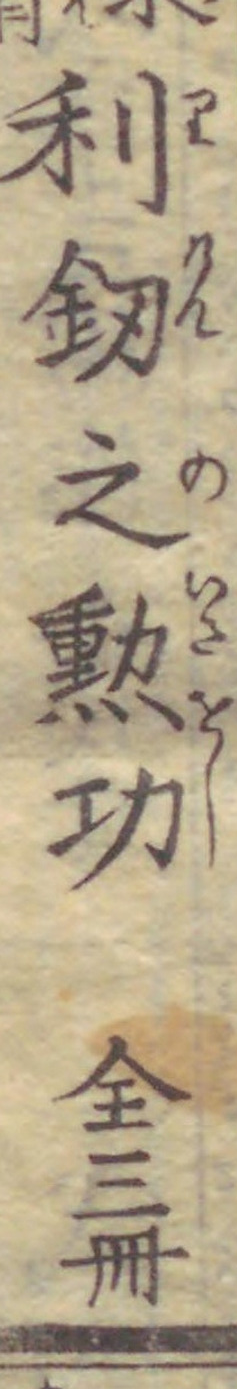利釼之勲功全三冊
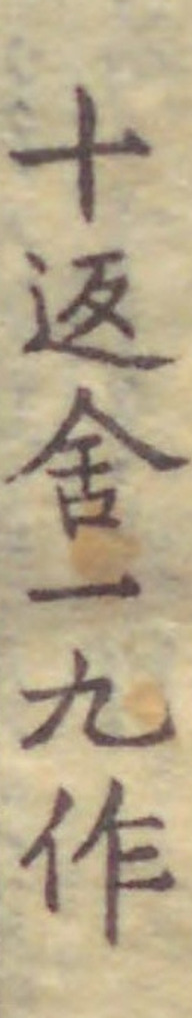十返舎一九作
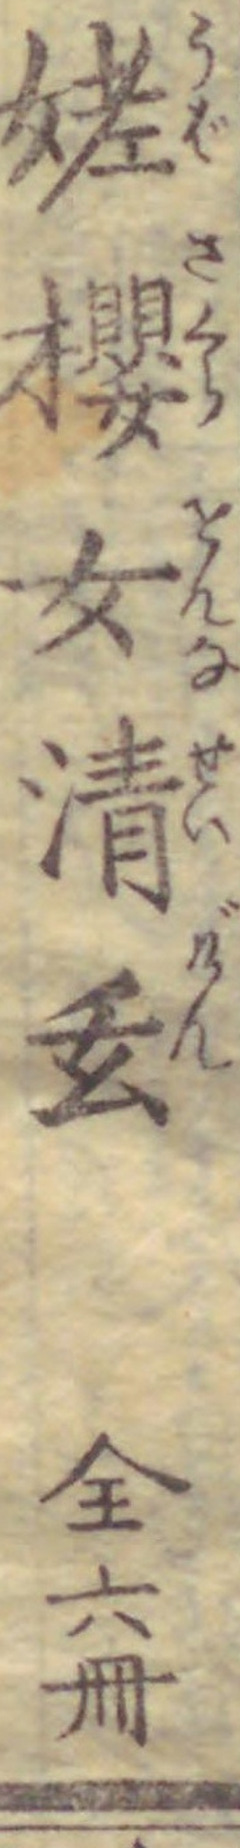姥桜女清玄全六冊
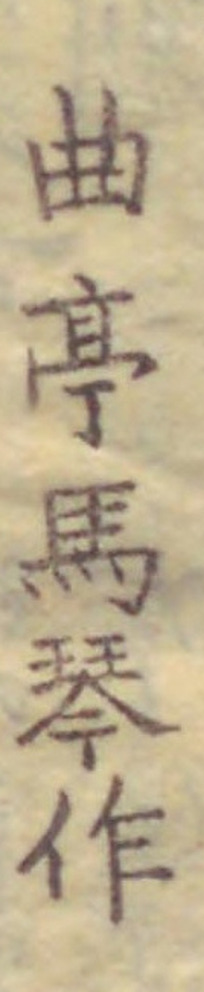曲亭馬琴作
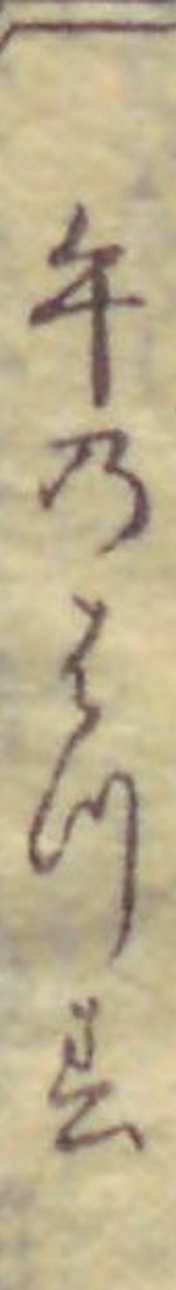午乃はつ春
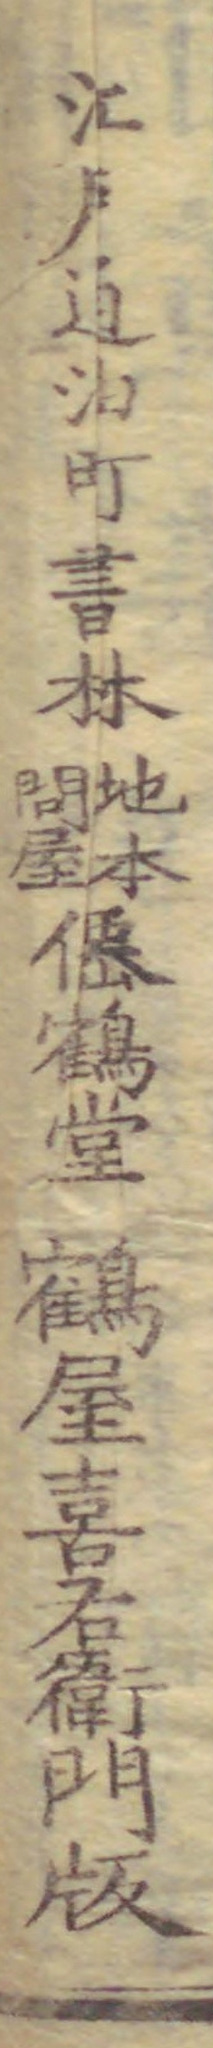江戸通油町書林地本問屋？鶴堂鶴や屋喜右衛門版
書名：八ツ目鱣因縁物語 3巻
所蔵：国立国会図書館 National Diet Library, JAPAN
